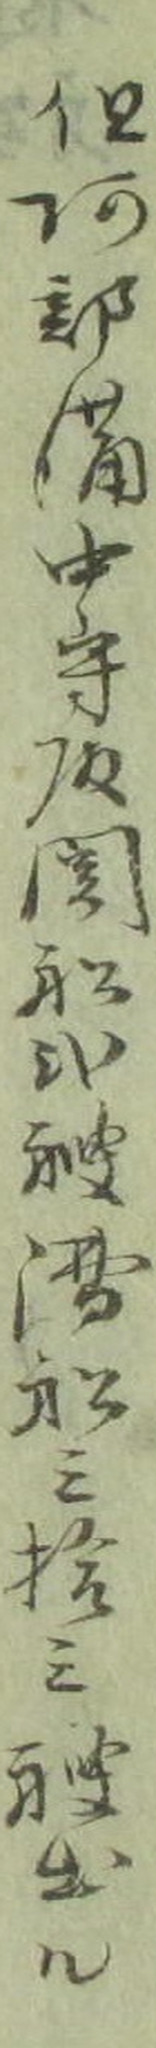但阿部備中守殿関船弐艘漕船三拾三艘出ル
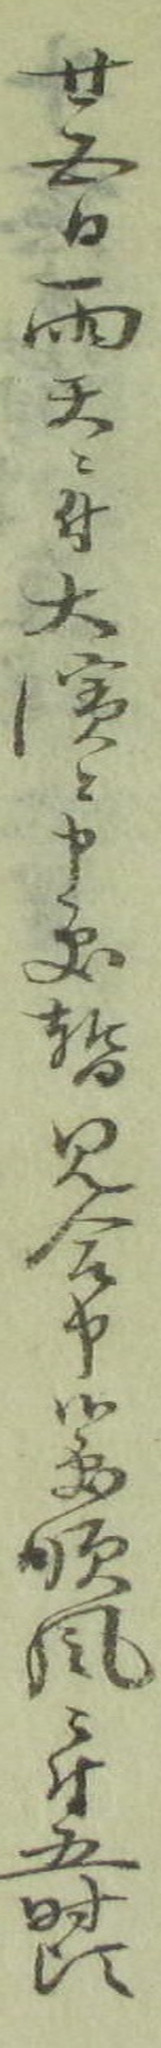廿五日雨天に付大浜と申処暫見合申候処順風に付五時頃
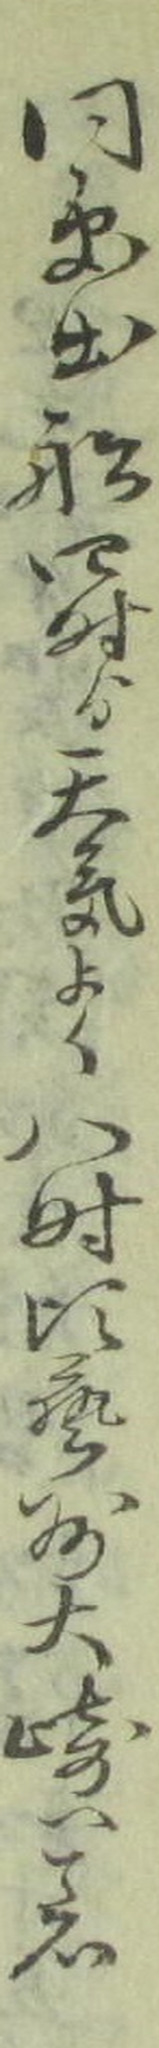同処出船四時ゟ天気よく八時頃芸州大崎へ着
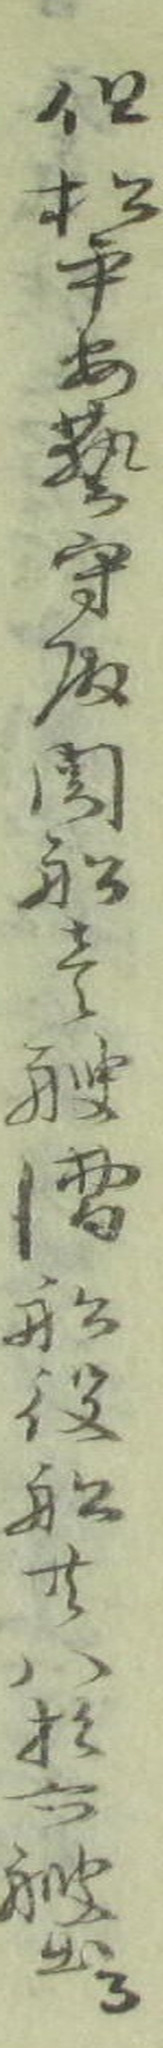但松平安芸守殿関船壱艘漕船役船共八拾六艘出る
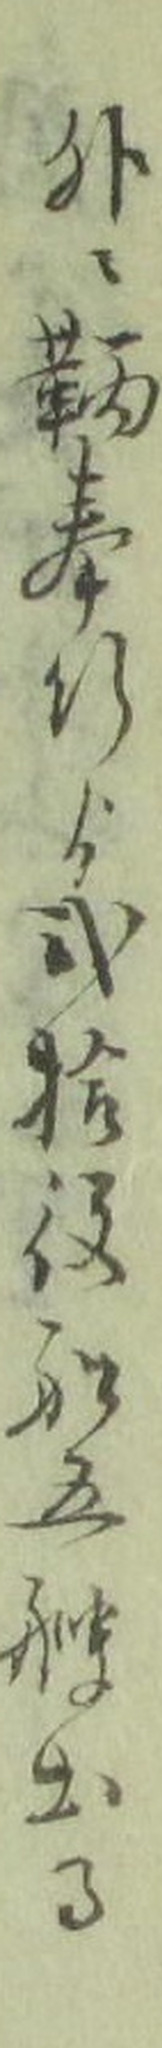外に鞆奉行ゟ弐拾役船五艘出る
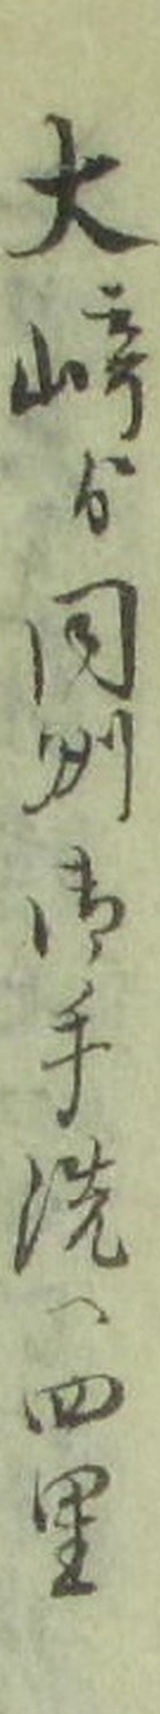大崎ゟ同州御手洗へ四里
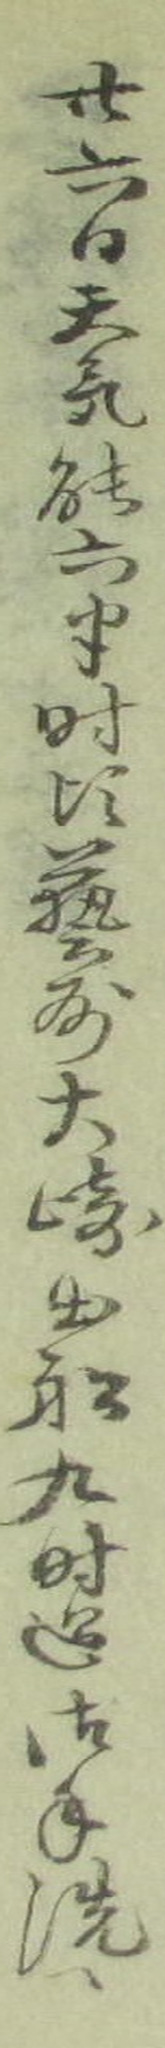廿六日天気能六半時頃芸州大崎出船九時過御手洗へ
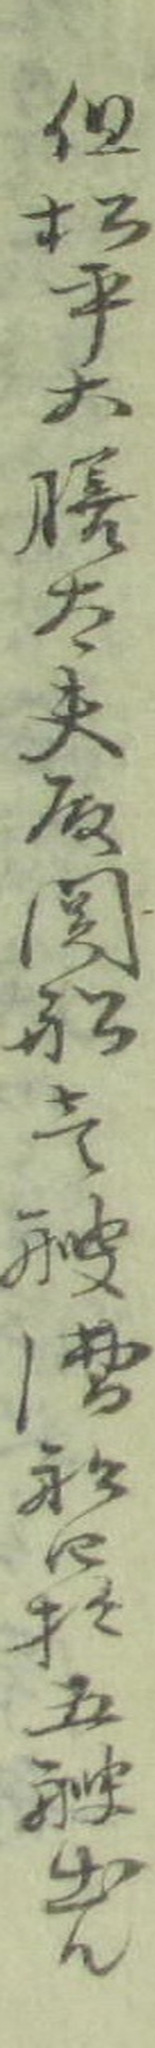但松平大膳太夫殿関船壱艘漕船四拾五艘出ル
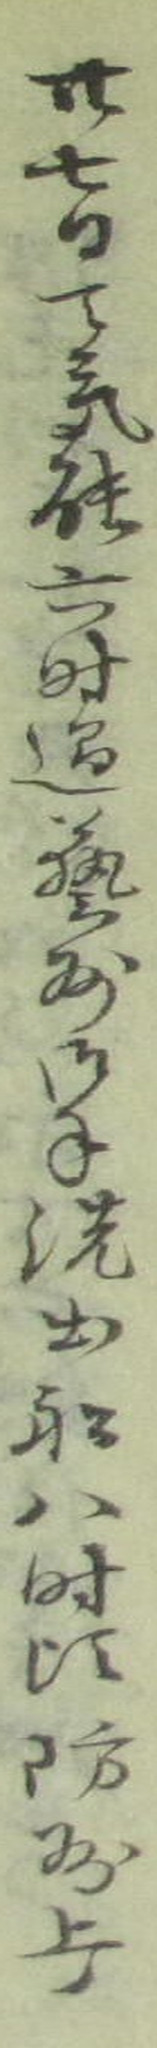廿七日天気能六時過芸州御手洗出船八時頃防州上ノ
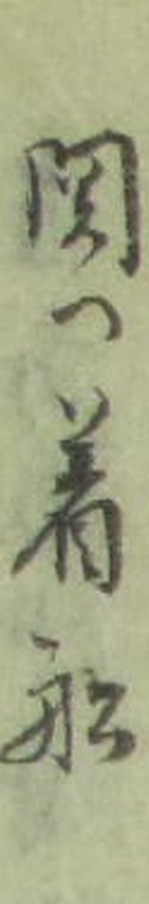関へ着船
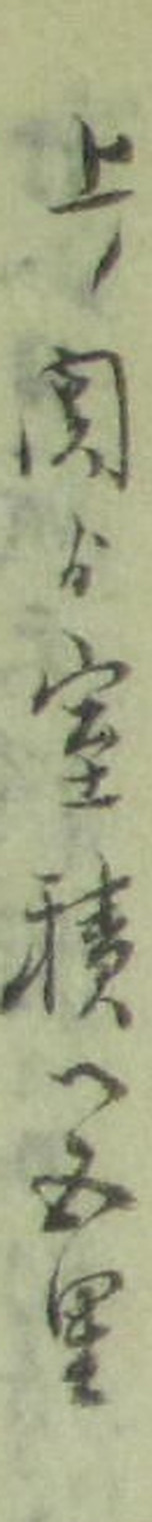上ノ関ゟ室積へ五里

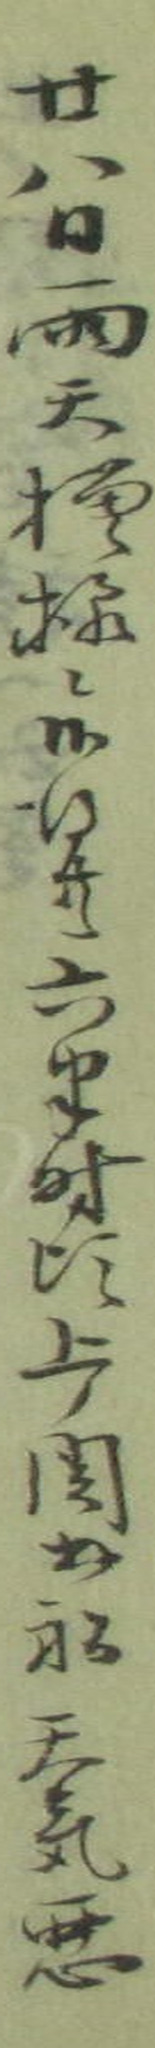廿八日雨天模様に候得共六半時頃上ノ関出船天気悪
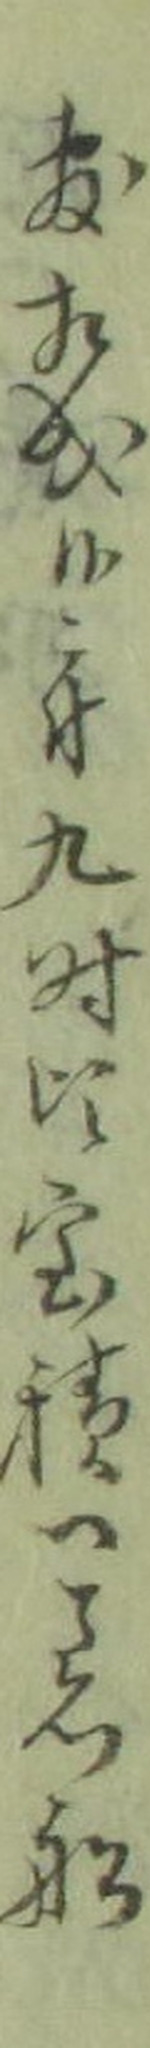敷相成候に付九時頃室積へ着船
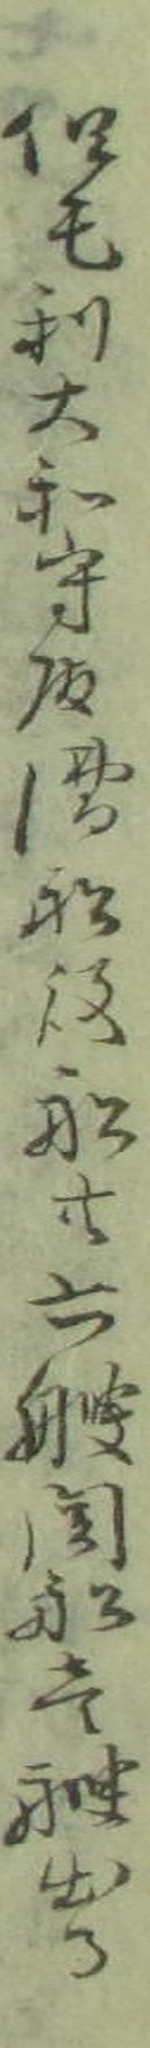但毛利大和守殿漕船役船共六艘関船壱艘出る
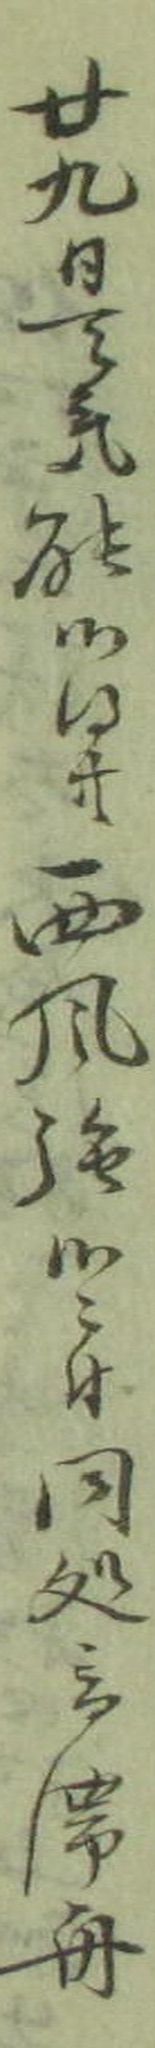廿九日天気能候得共西風強候に付同処ｎ而滞舟
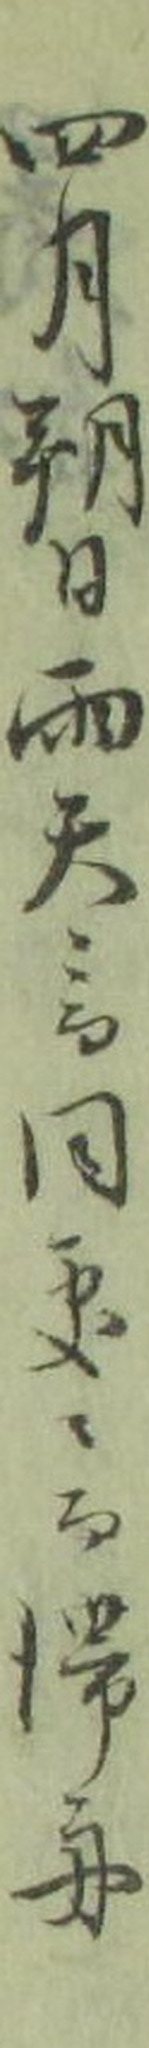四月朔日雨天に而同処に而滞舟
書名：紀州九木浦庄屋記録 四
